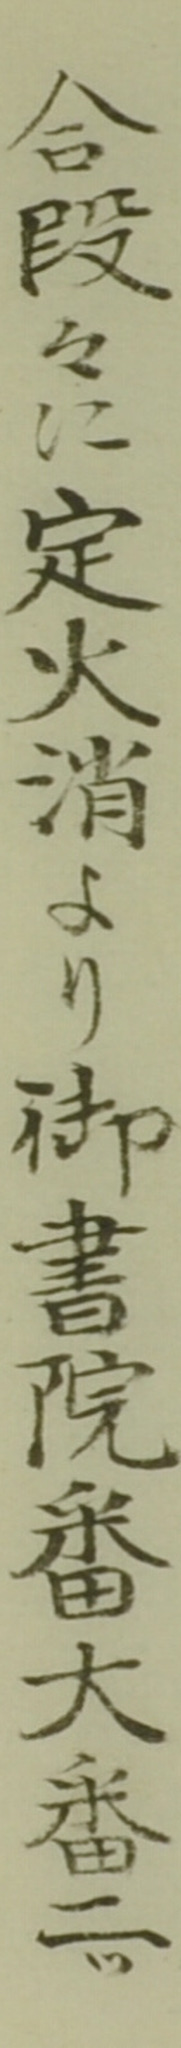合段々に定火消より御書院番大番二つ
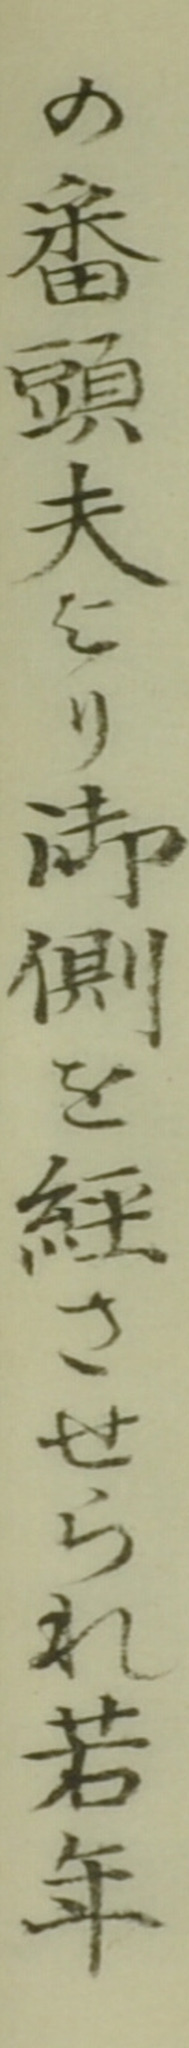の番頭夫より御側を經させられ若年
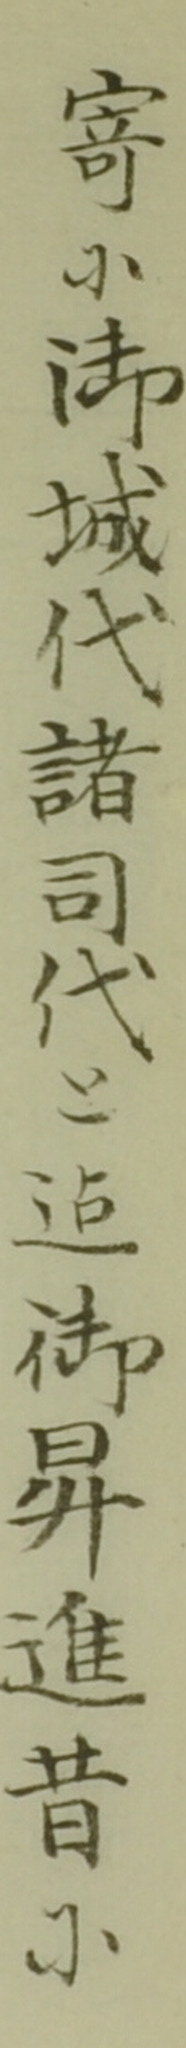寄に御城代諸司代と迄御昇進昔に
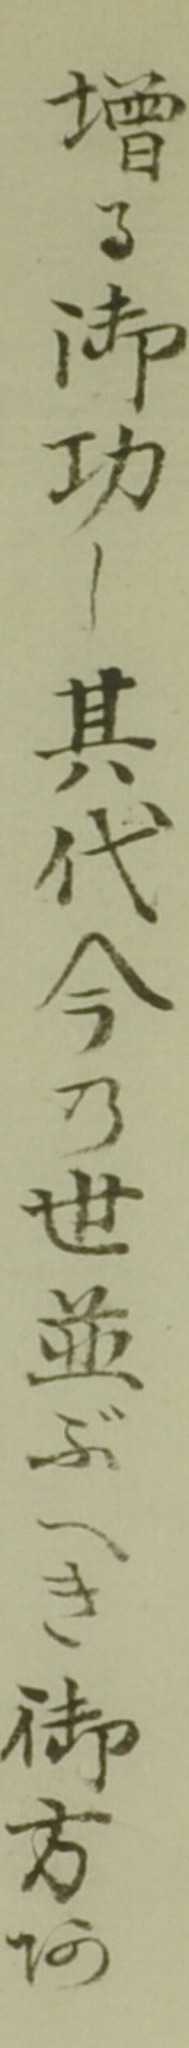増る御功し其代今の世並ぶへき御方あ
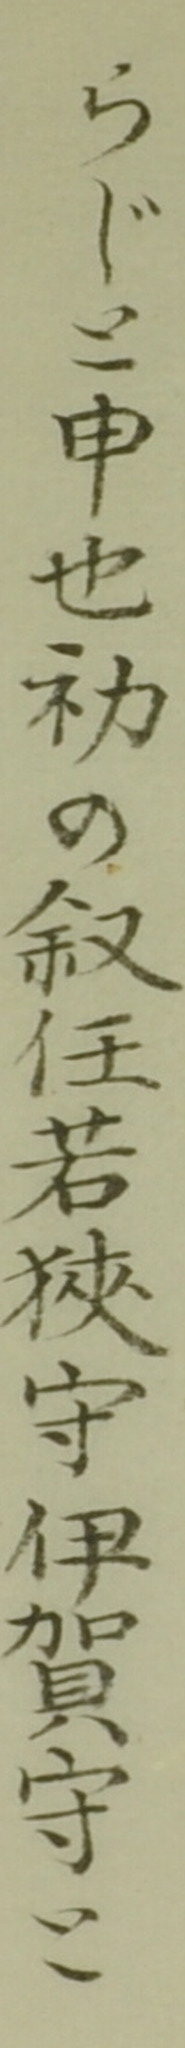らじと申也初の叙任若狭守伊賀守と
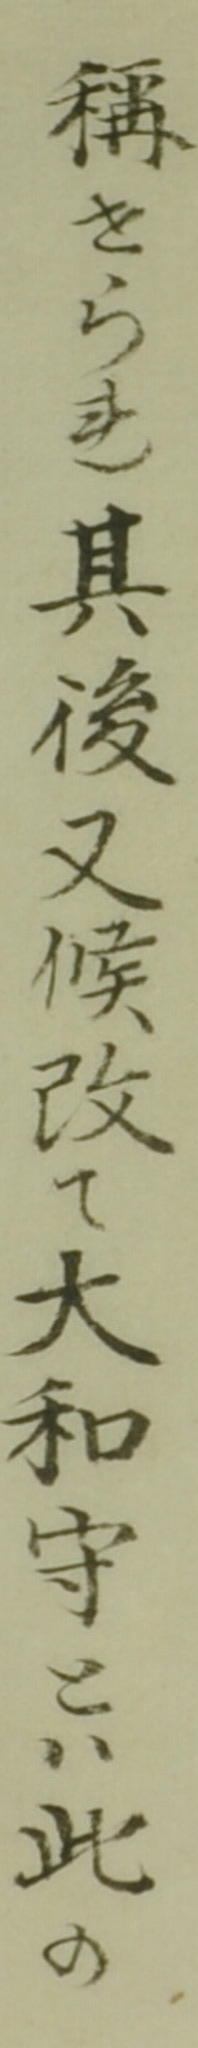稱せられ其後又候改て大和守とは此の
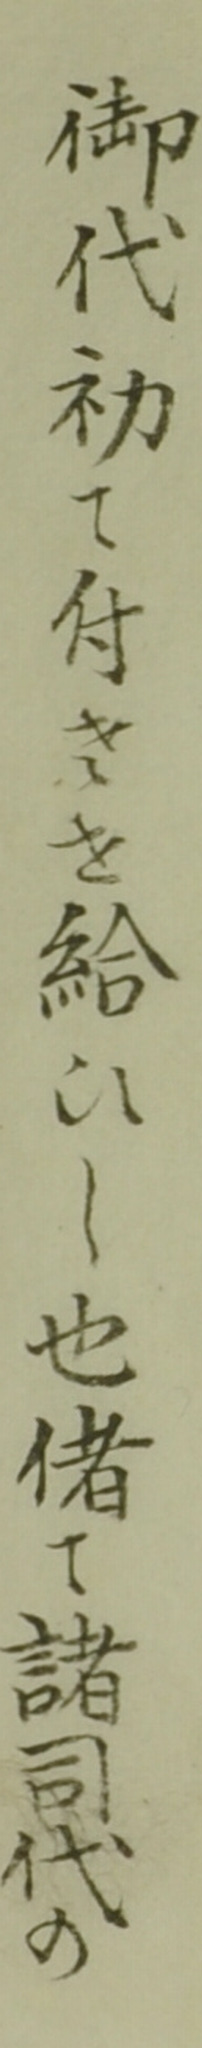御代初て付させ給ひし也偖て諸司代の
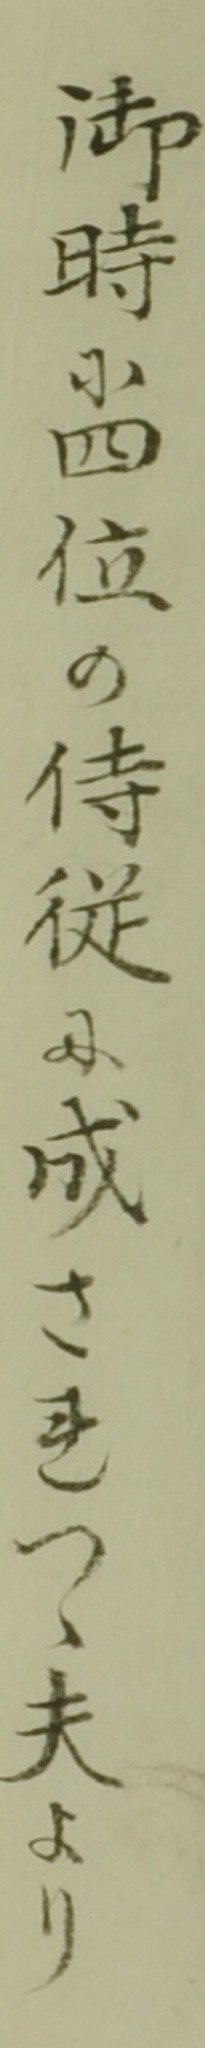御時に四位の侍従に成されつゝ夫より

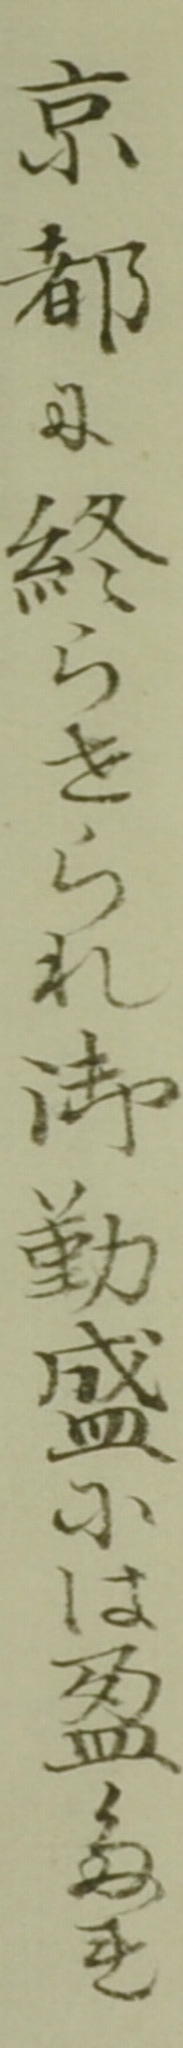京都に終らせられ御勤盛には盈たれ
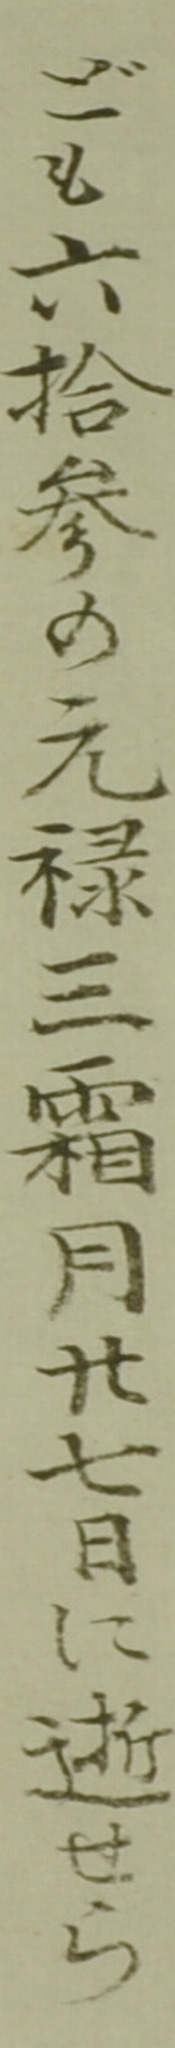ども六拾参の元禄三霜月廿七日に逝せら
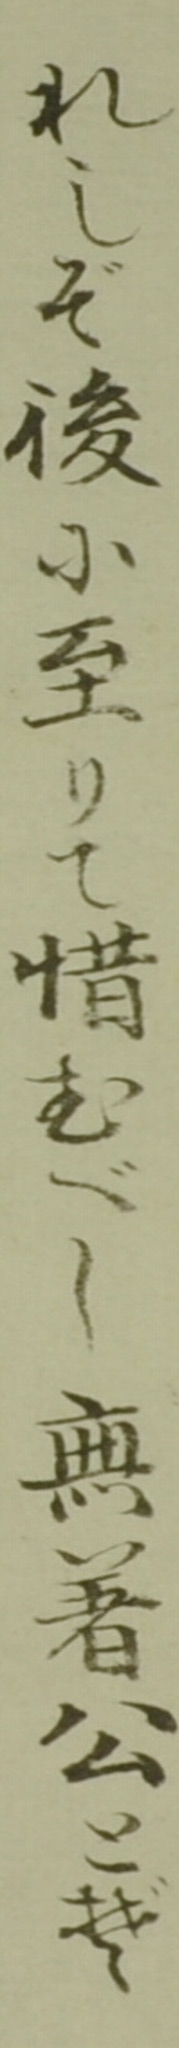れしぞ後に至りて惜むべし無着公とぞ
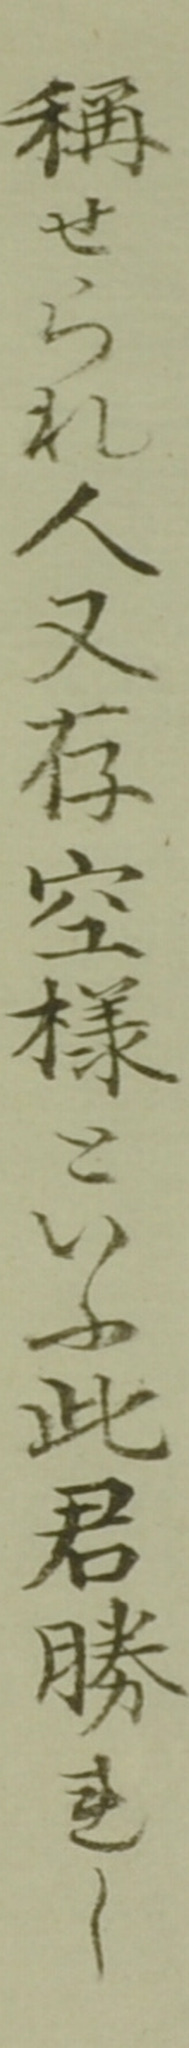称せられ人又存空様といふ此君優れし
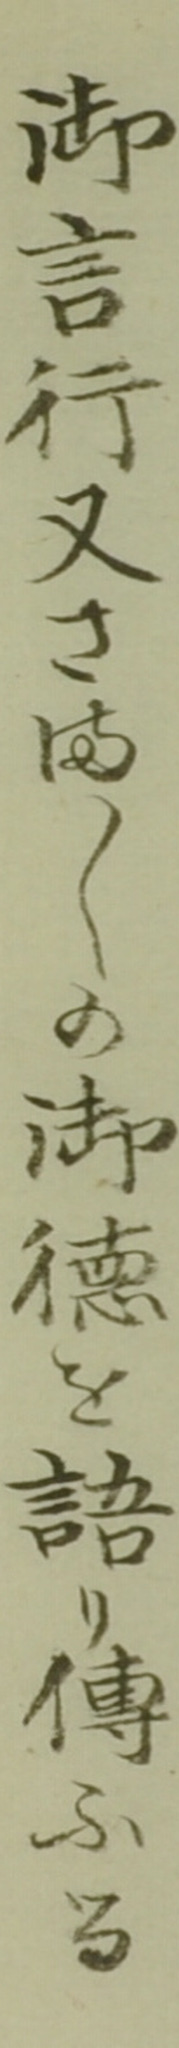御言行又さま〳〵の御徳を語り伝ふる
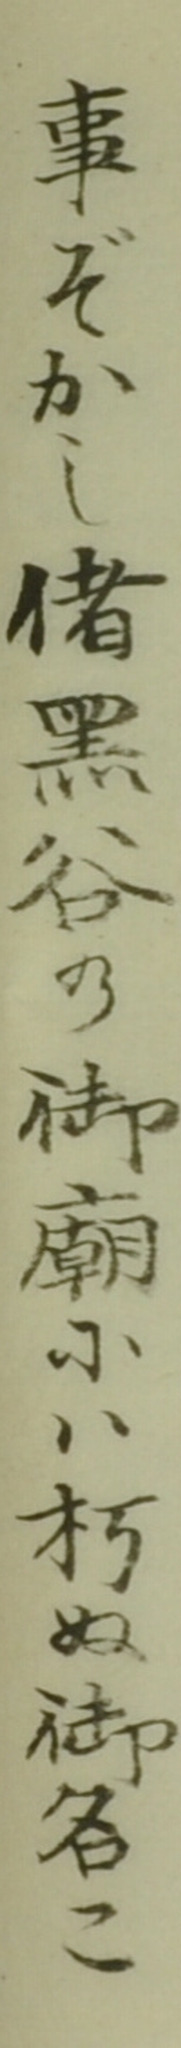事ぞかし偖黒谷の御廟には朽ぬ御名こ
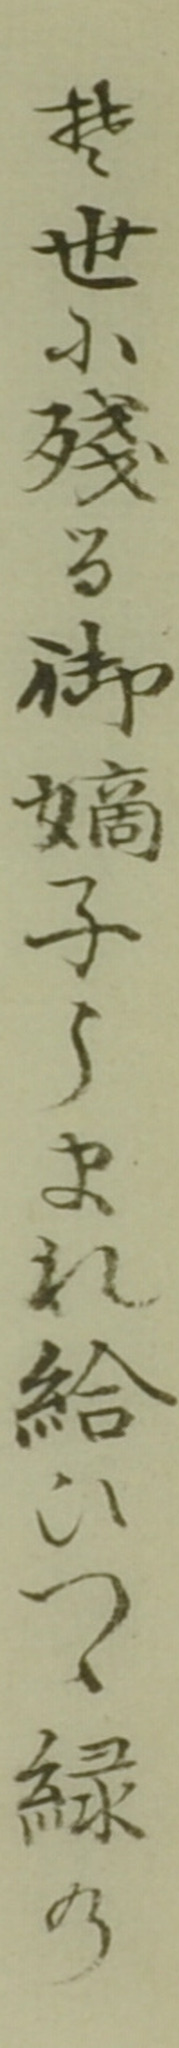そ世に残る御嫡子うまれ給ひつゝ緑の
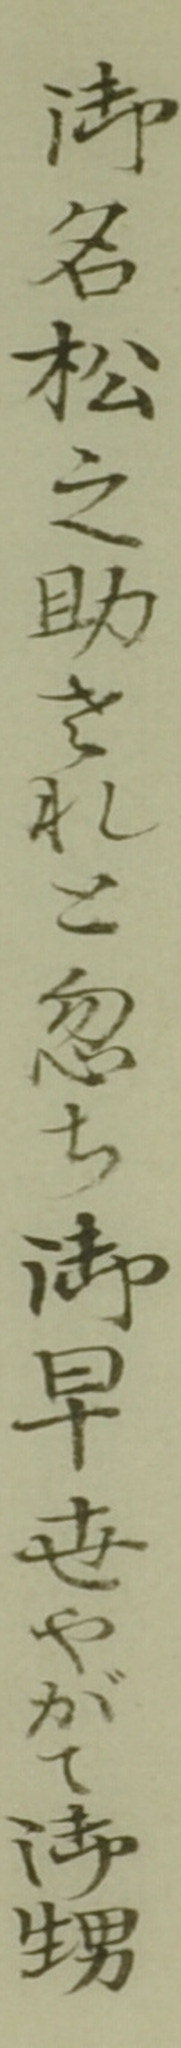御名松之助されと忽ち御早世やがて御甥
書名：藤葛（全）
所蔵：伊那市立高遠町図書館・合同会社AMANE
